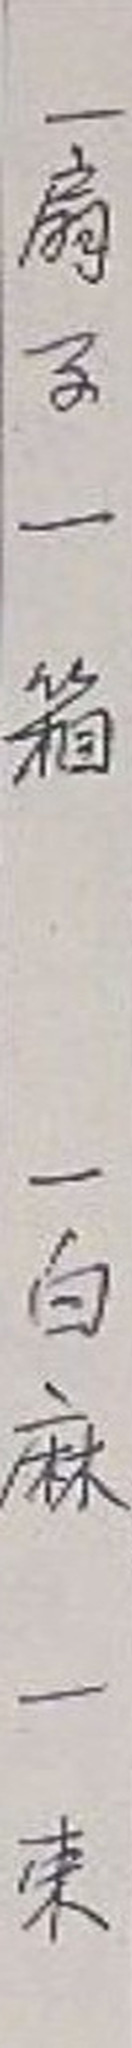一扇子一箱一白麻一束
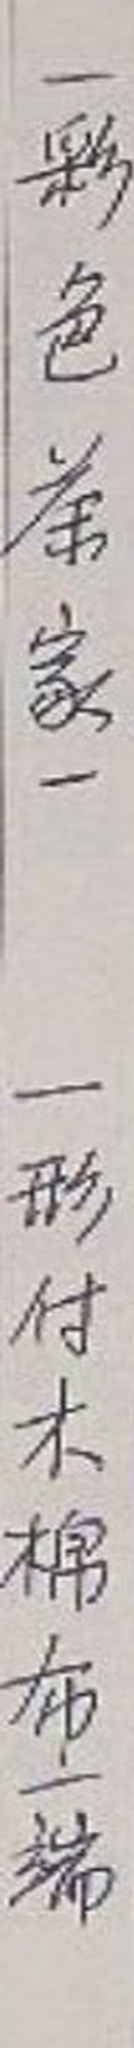一彩色茶家一一形付木棉布一端
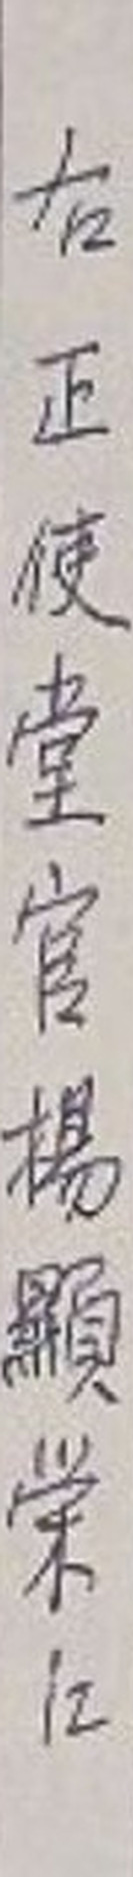右正使堂官楊顕栄え
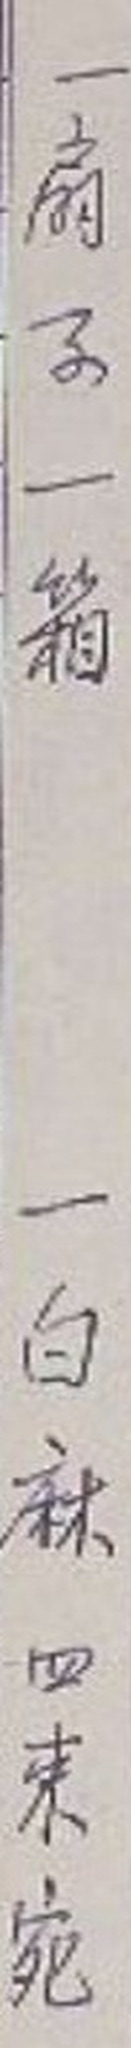一扇子一箱一白麻四束宛
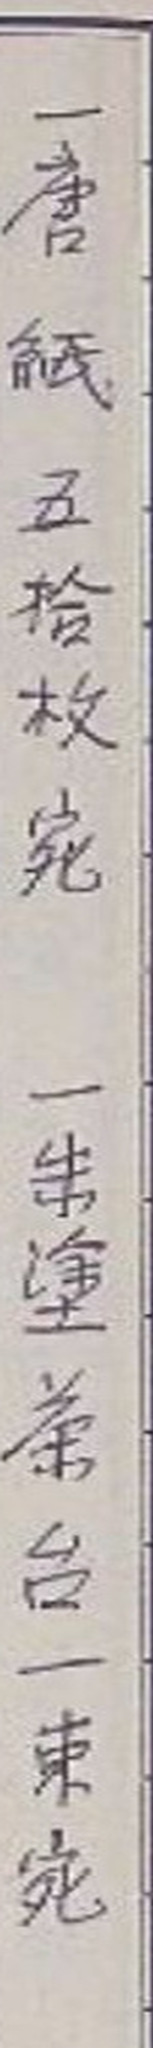一唐紙五拾枚宛一朱塗茶台一束宛
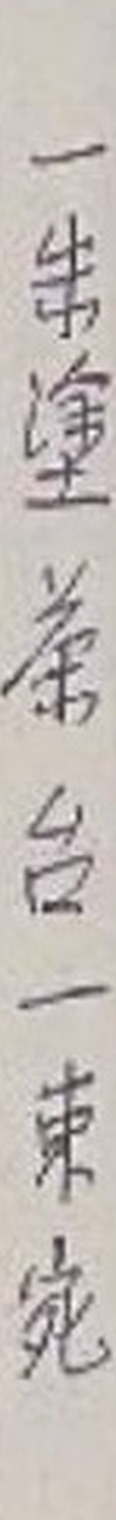一唐紙五拾枚宛一朱塗茶台一束宛
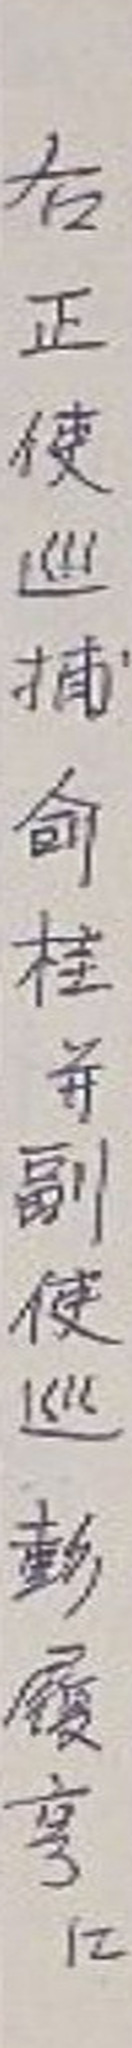右正使巡捕兪桂并副使巡捕彭履亨え
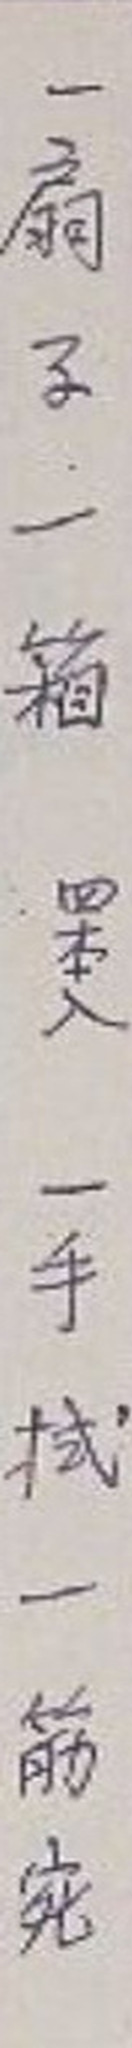一扇子一箱四本入一手拭一筋宛
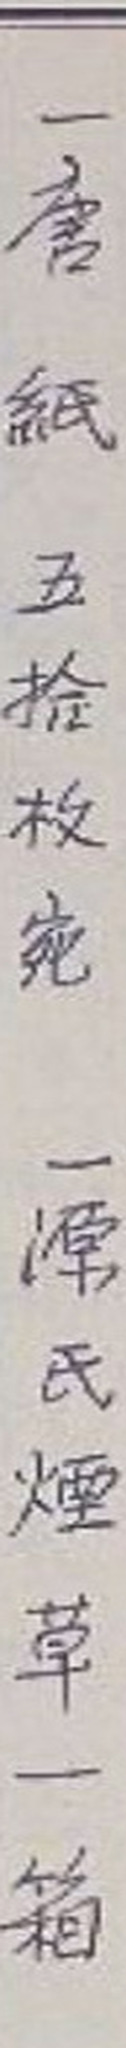一唐紙五拾枚宛一源氏煙草一箱
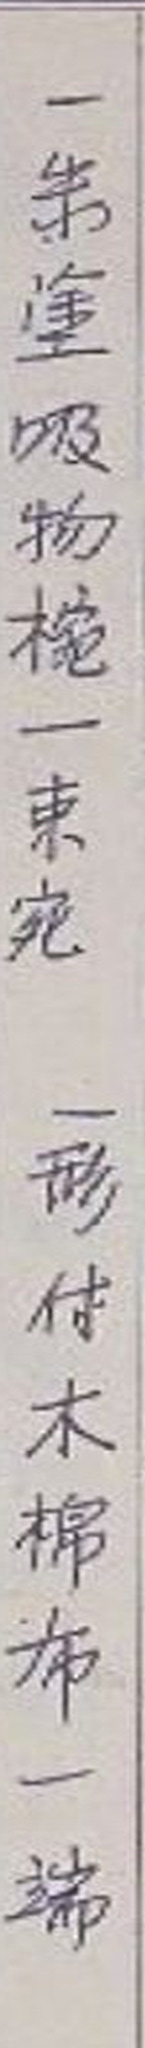一朱塗吸物椀一束宛一形付木棉布一端
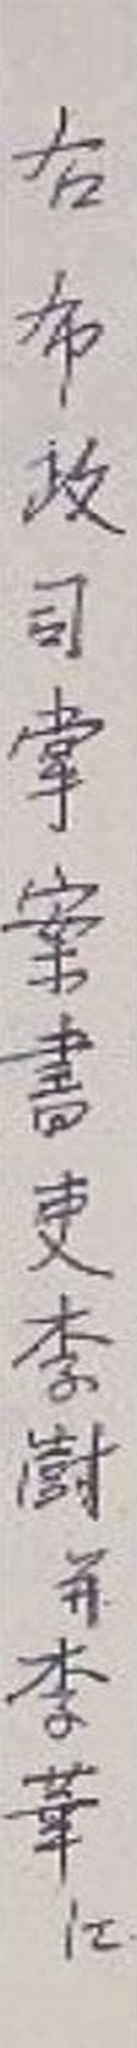右布政司掌案書吏李澍并李華え
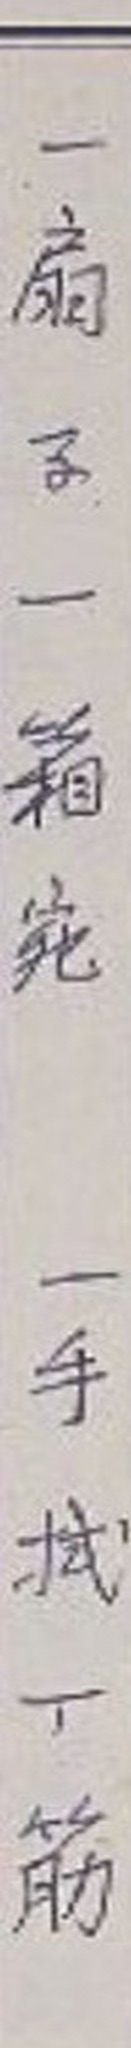一扇子一箱宛一手拭一筋
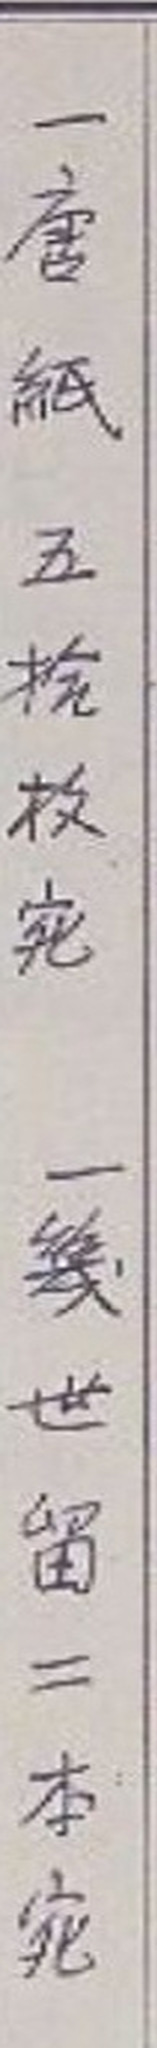一唐紙五拾枚宛一幾世留二本宛
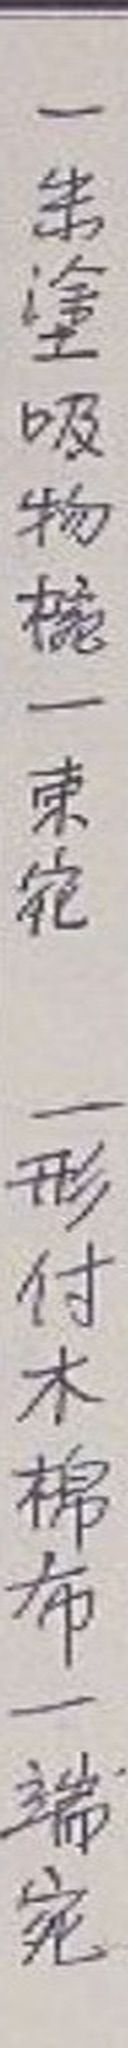一朱塗吸物椀一束宛一形付木棉布一端宛
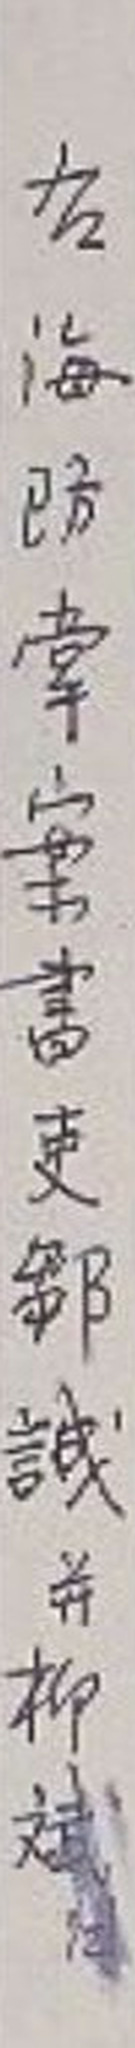右海防掌案書吏鄒誠并柳斌え
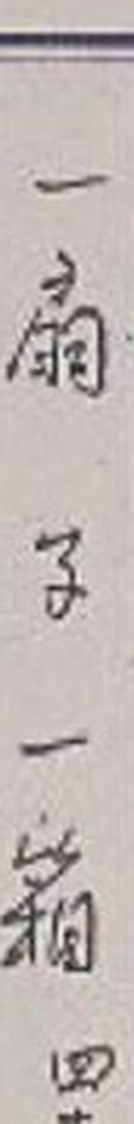一扇子一箱一白麻一束
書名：支那冊封使来琉諸記 下巻
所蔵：University of the Ryukyus Library
